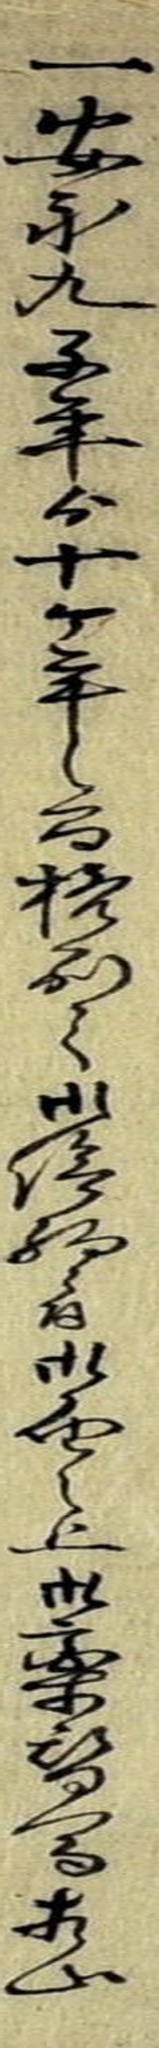一安永九子年ゟ十ケ年之間格別之御倹約ニ付御届之上御牽替馬相止
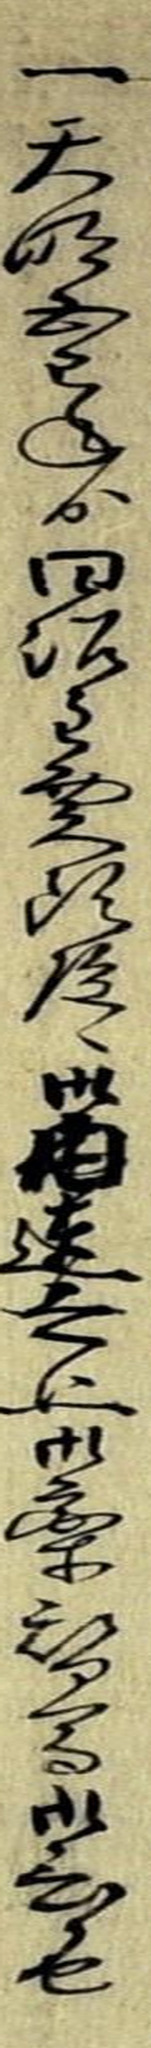一天明五巳年ゟ田沼主殿頭殿へ御用達之上御牽替馬御ひかせ
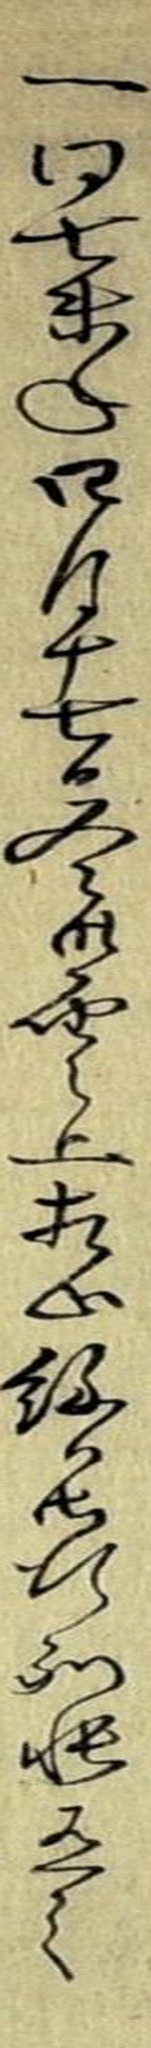一同七未年四月十七日又々御届之上相止余ハ御行列帳有之
